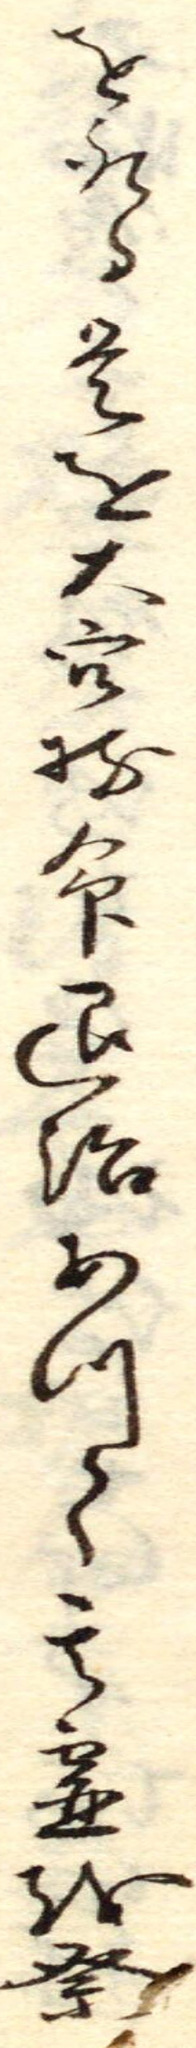を取る是を大穴持命退治あつて其霊を祭
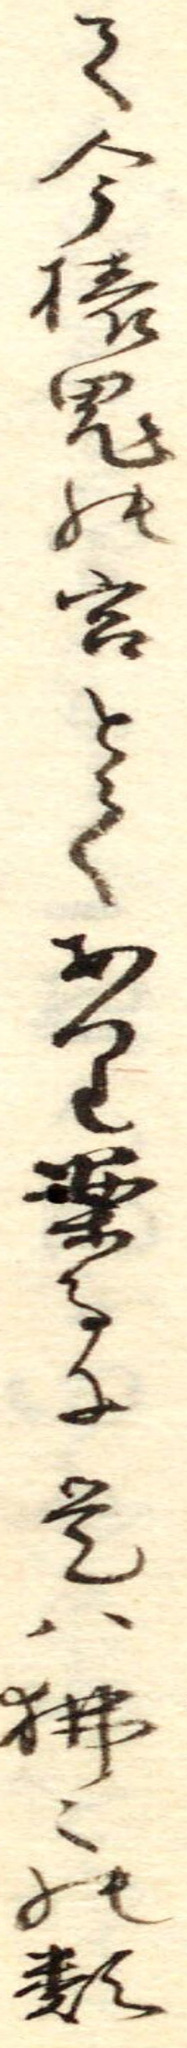て今猿鬼の宮とてあり案るに是は狒の類
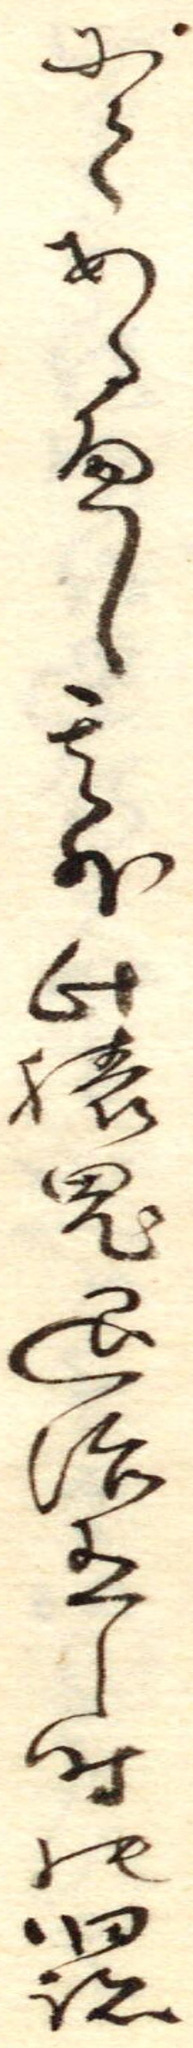にてあるへし其外此猿鬼退治有し時の旧跡
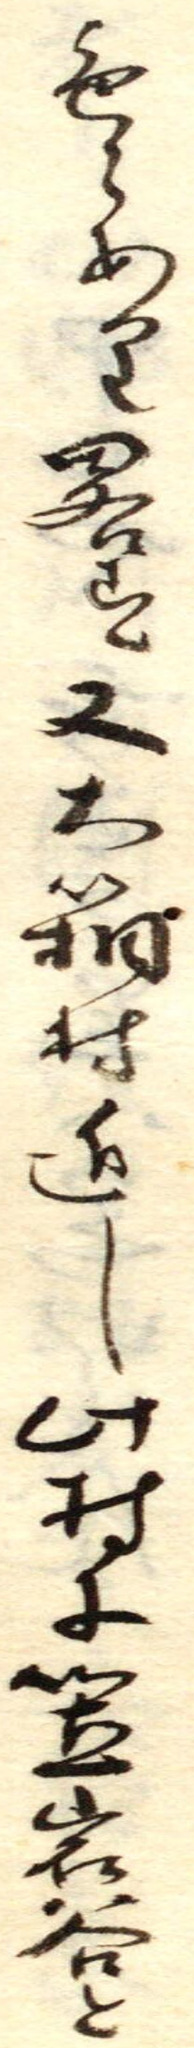色々あり略す又大箱村近し此村に笠岩谷と
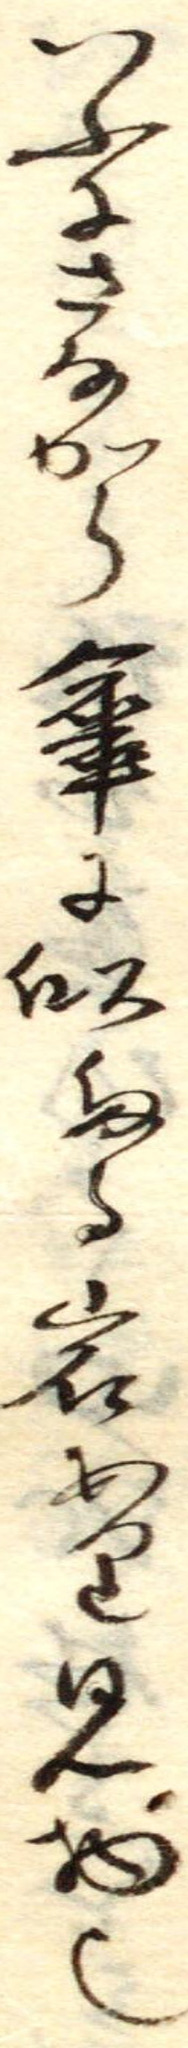いふにさなから傘に似たる岩あり見物也

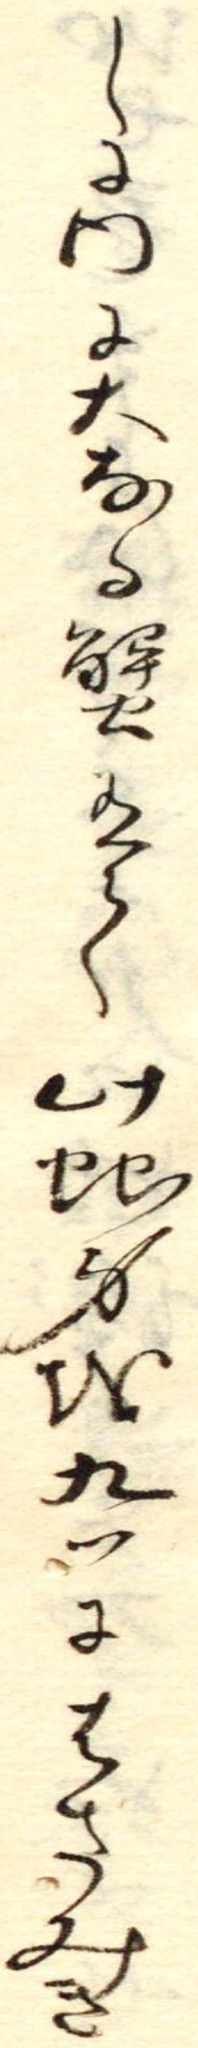しに門に大なる蟹有て此蛇身を九ッにはさみき
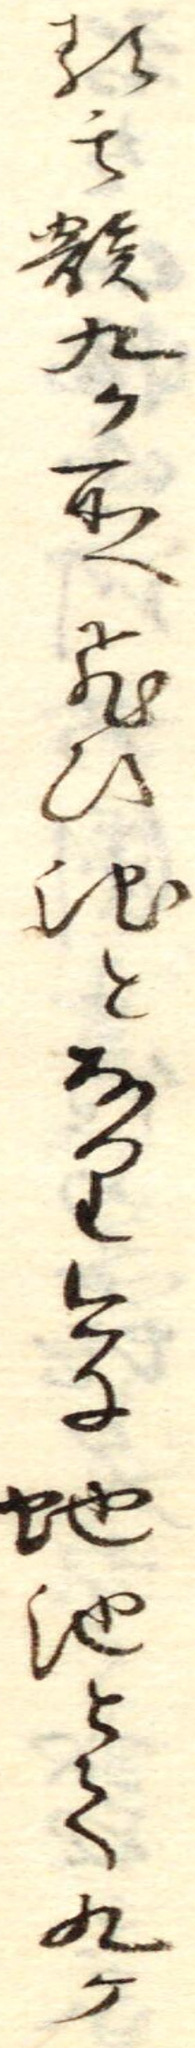る其骸九ヶ所へ飛ひ池となり今に蛇池とて九ヶ
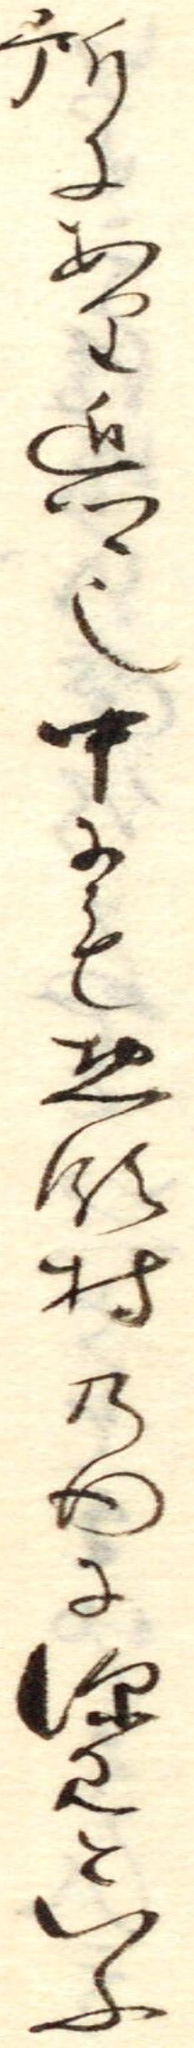所にあり近郷也中にも惣領村の内に深見といふ
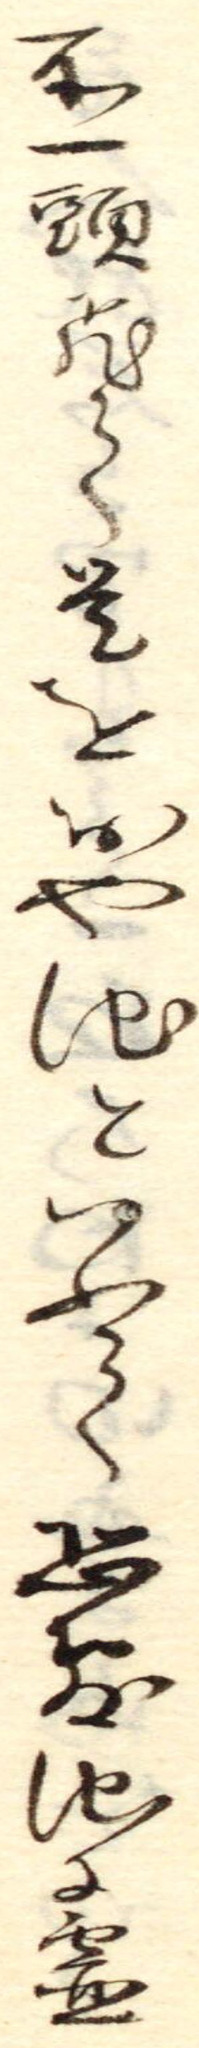所へ頭飛て是をおや池といふて恐敷池に霊
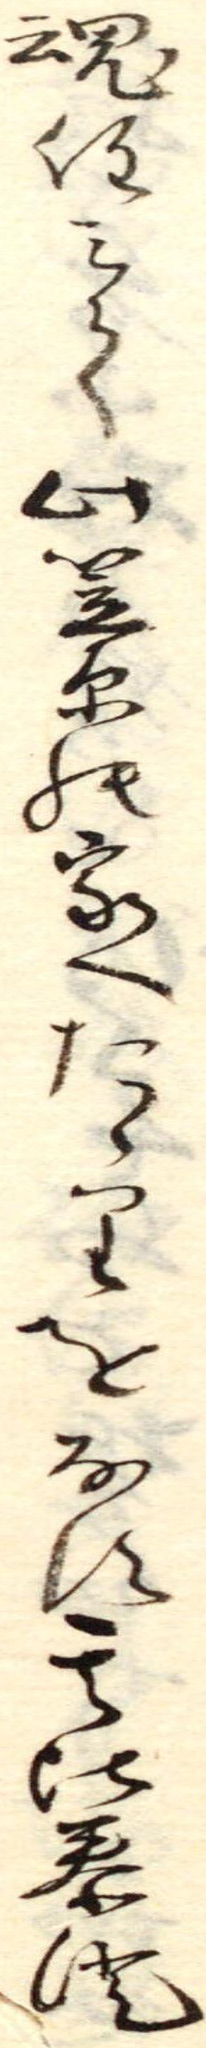魂住みて此笠原の家へたゝりををなす其比泰澄
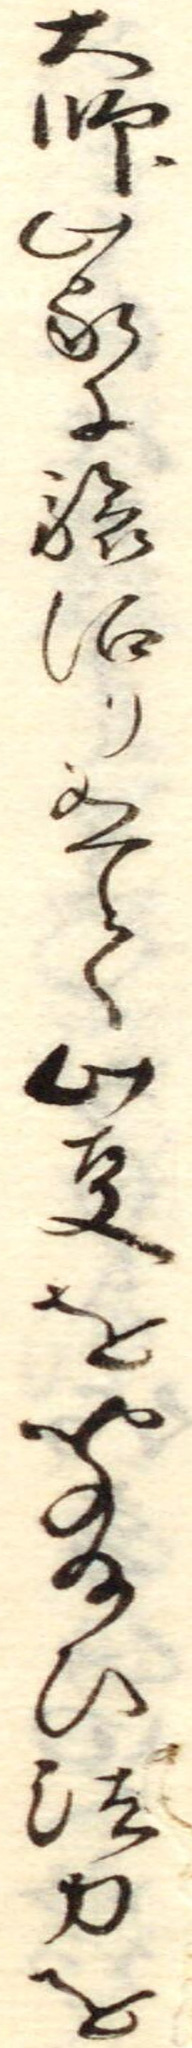大師此家に旅泊り有て此事を聞給ひ法力を
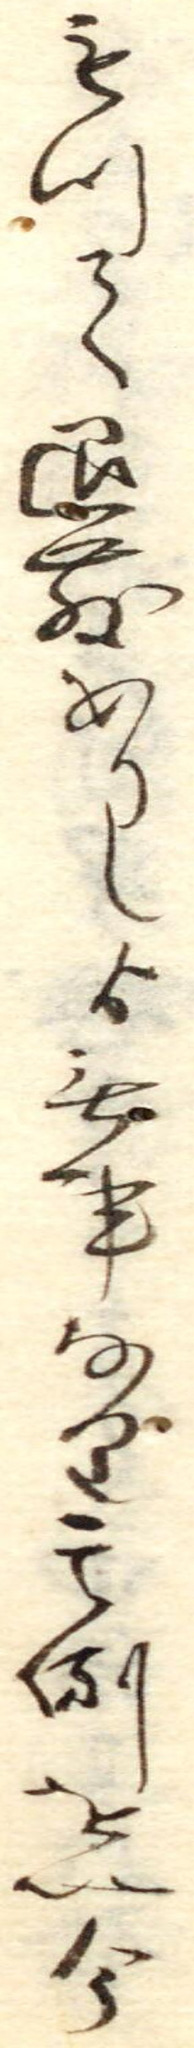もつて退散ありしゟ無事なり其例を以今
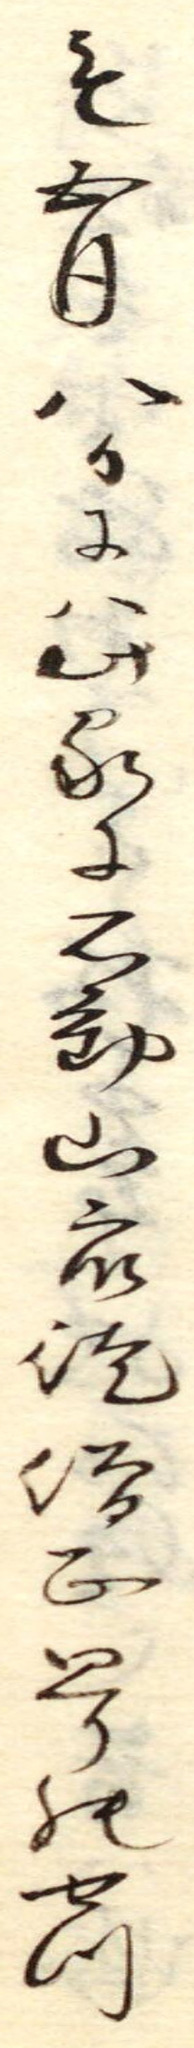も五月八日には此家に石動山衆徒僧正廻りのせつ
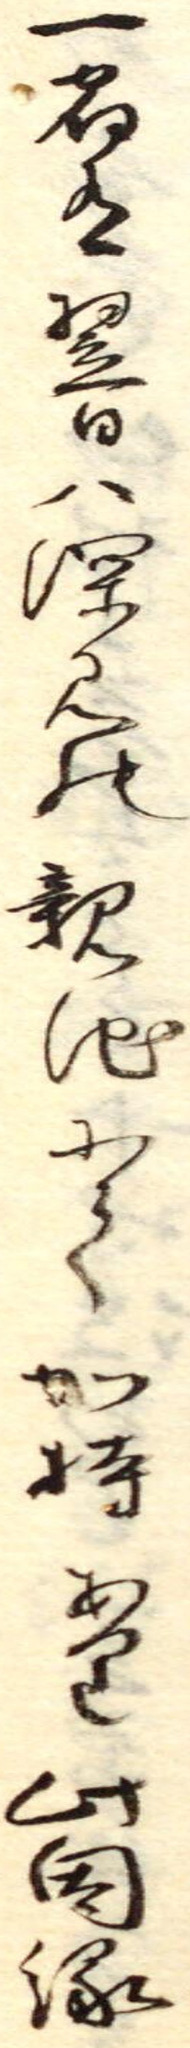一宿有翌日は深見の親池にて加持あり此周縁
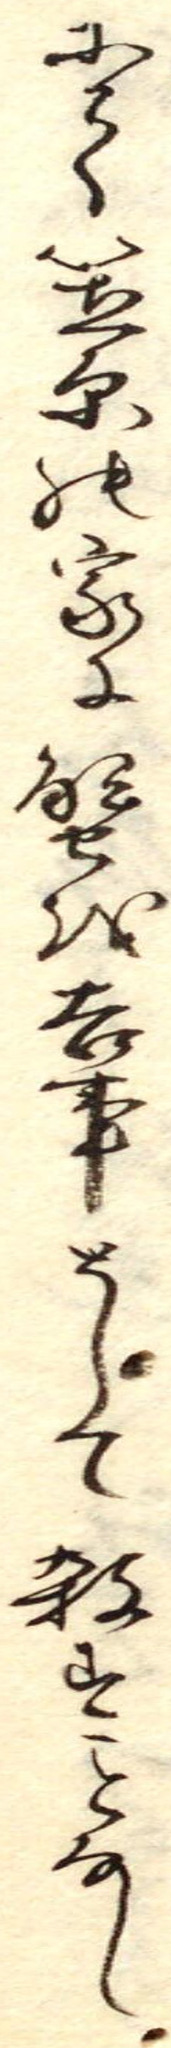にて笠原の家に蟹を吉事として殺すことなし
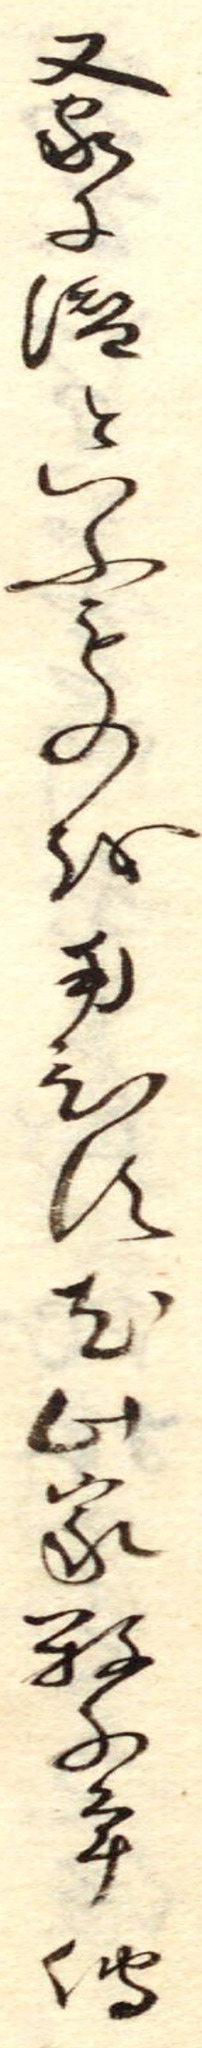又家に潜といふものを用ひす尤此家数千年伝
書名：能登名跡誌
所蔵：Ishikawa Prefectural Library
